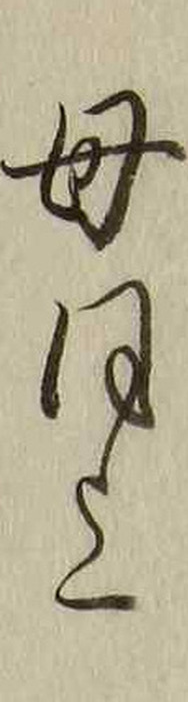母同上
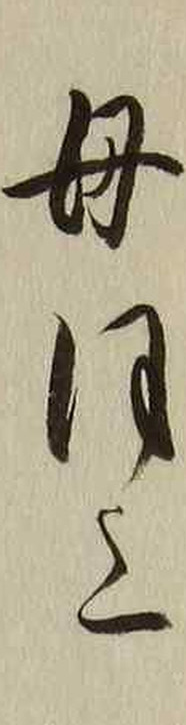母同上
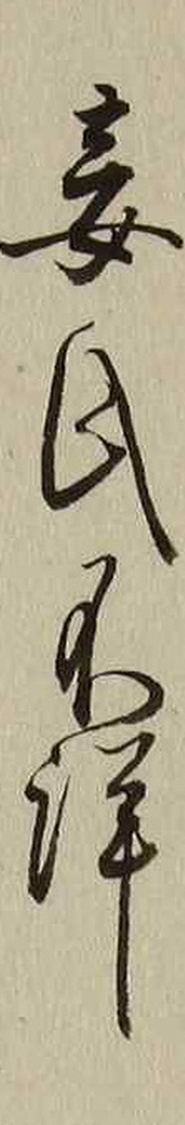妻氏不詳
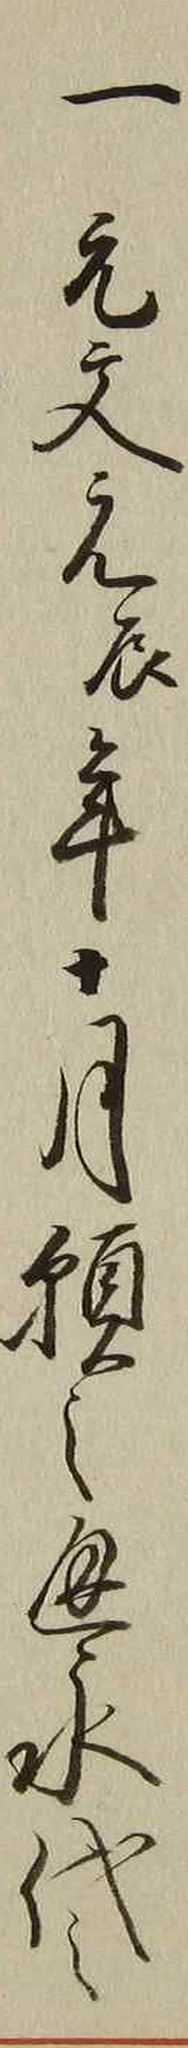一元文元辰年十月願之通永代之
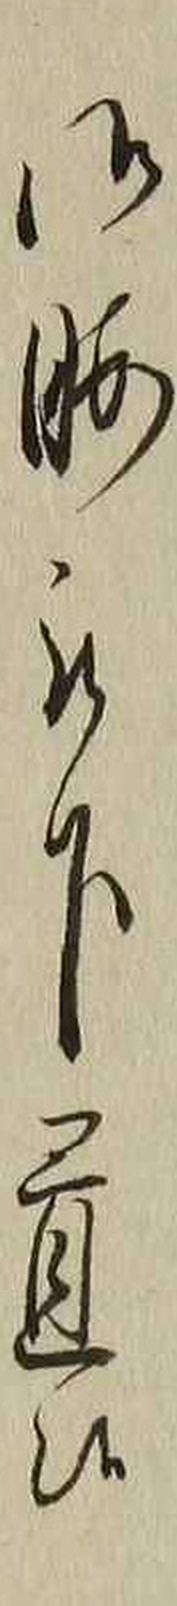御暇被下置候
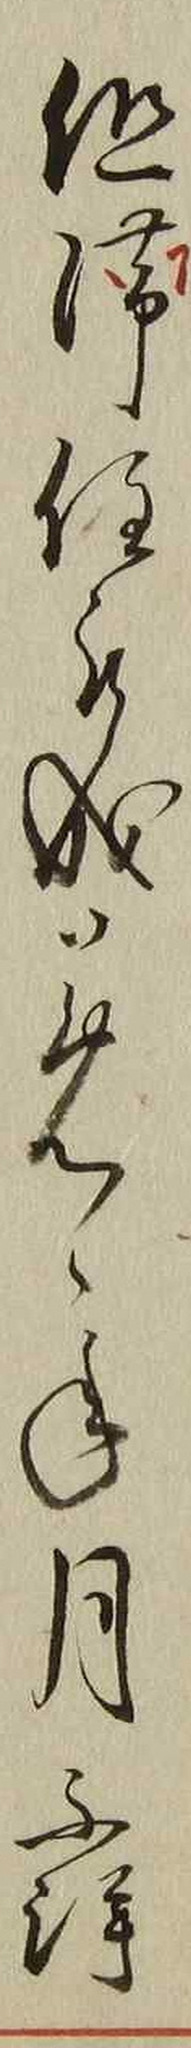但滞住被成御免候年月不詳
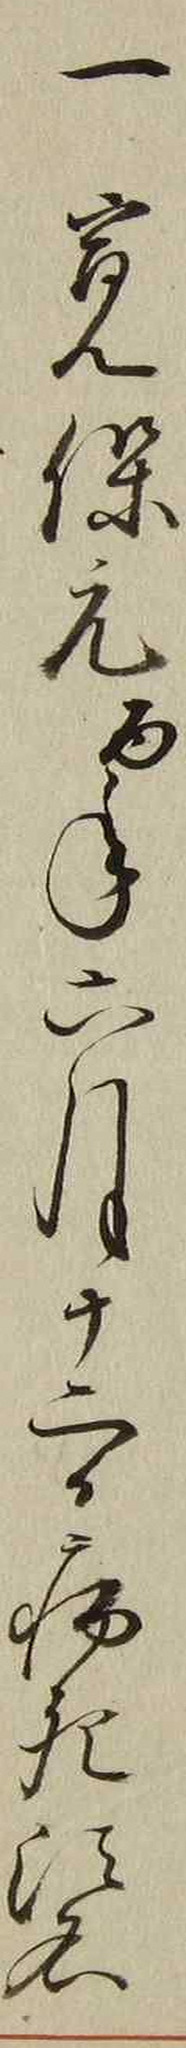一寛保元酉年六月十二日病死法名
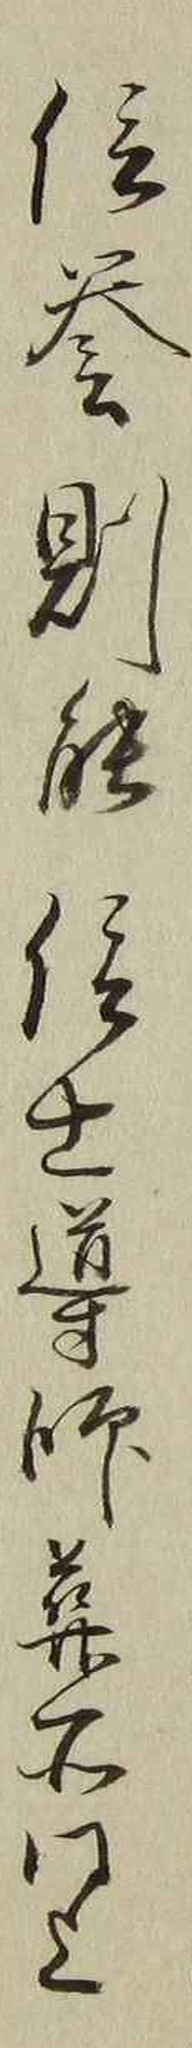信誉則能信士導師葬所同上

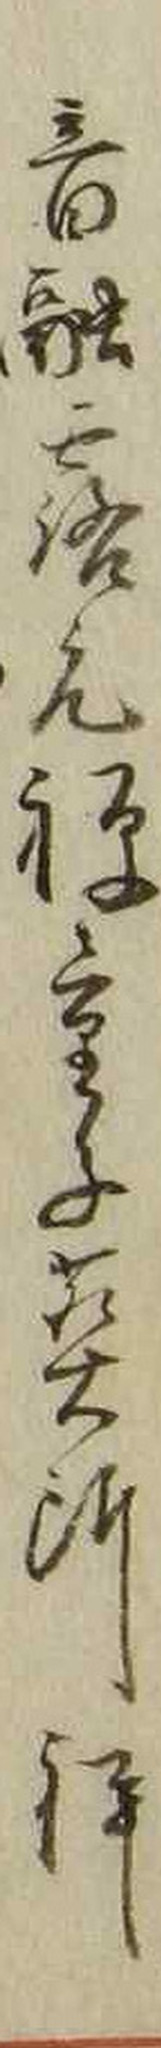音融露元童子葬所祥
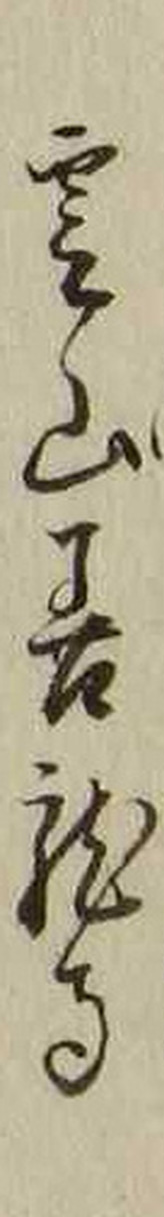雲山善龍寺
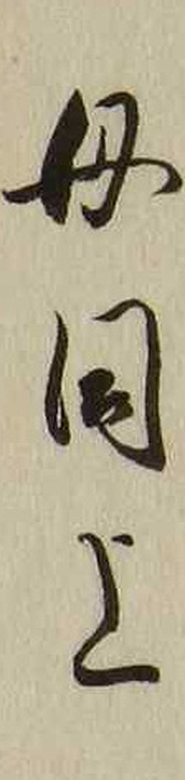母同上
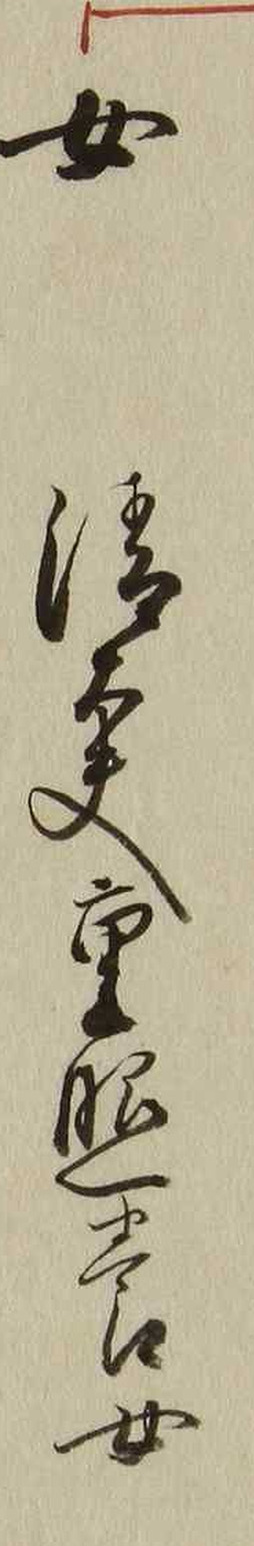女清大夫重照養女
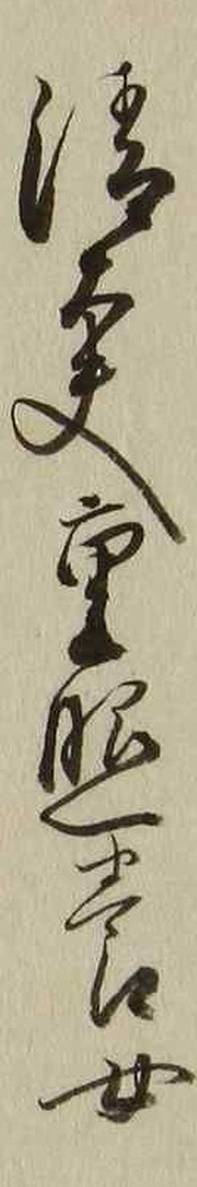女清大夫重照養女
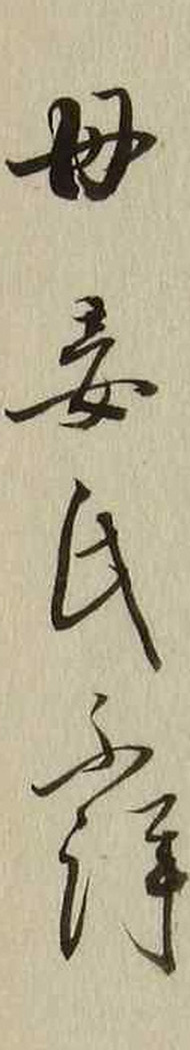母妾氏不詳
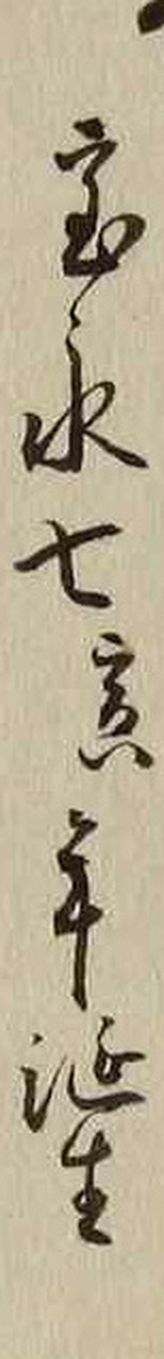宝永七寅年誕生
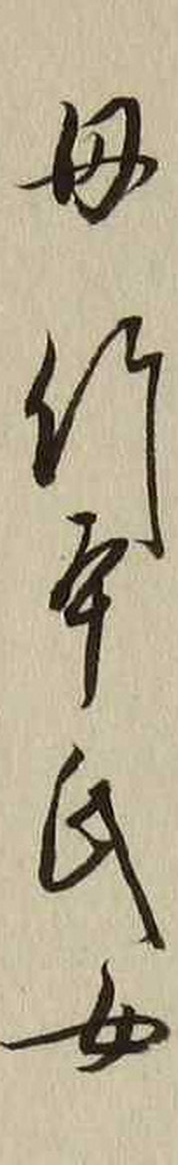母行本氏女
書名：諸士系譜　巻之2　い之部2
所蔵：会津若松市立会津図書館
